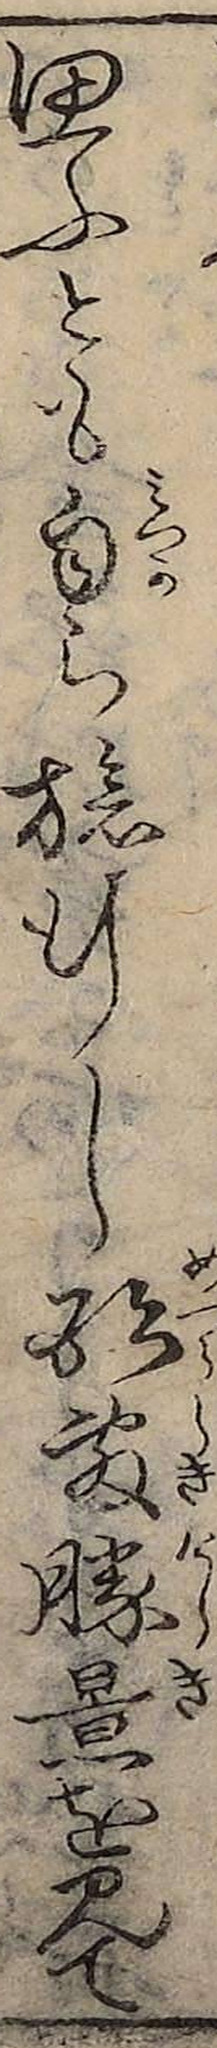思ふとも自ら旅行し珍敷勝景を見て
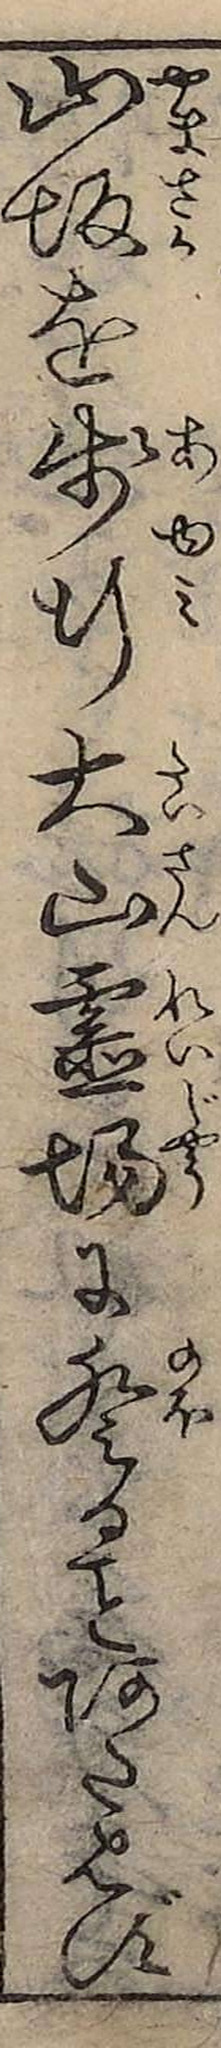山坂を歩行大山霊場に登ることあたはず

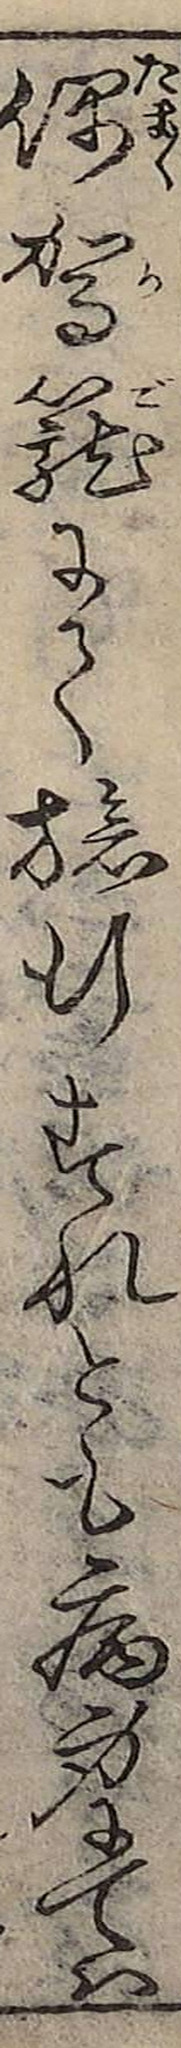偶駕籠にて旅行すれとも病身にては
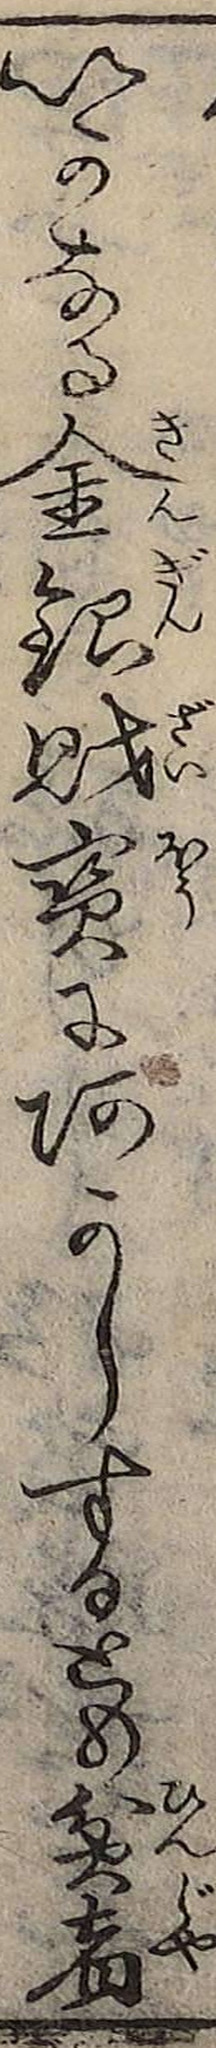いかなる金銀財宝にあかしするとも貧者
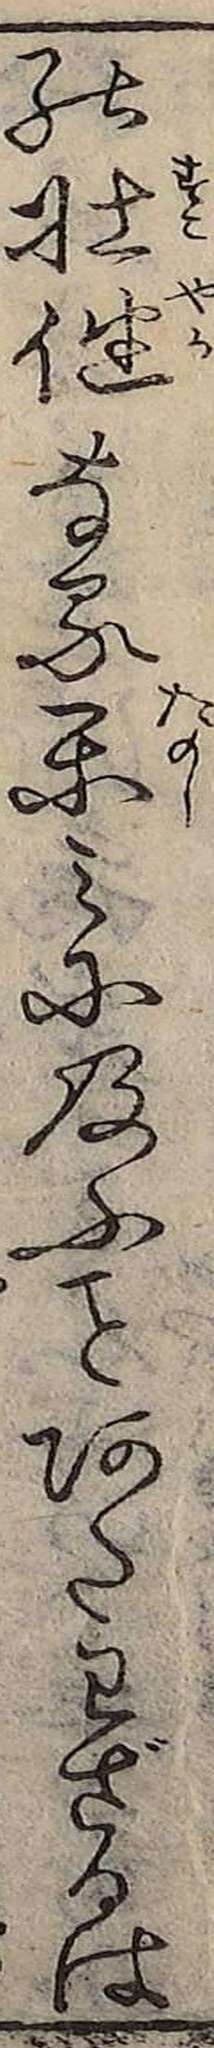の壮健なる楽みに及ふことあたわざるは
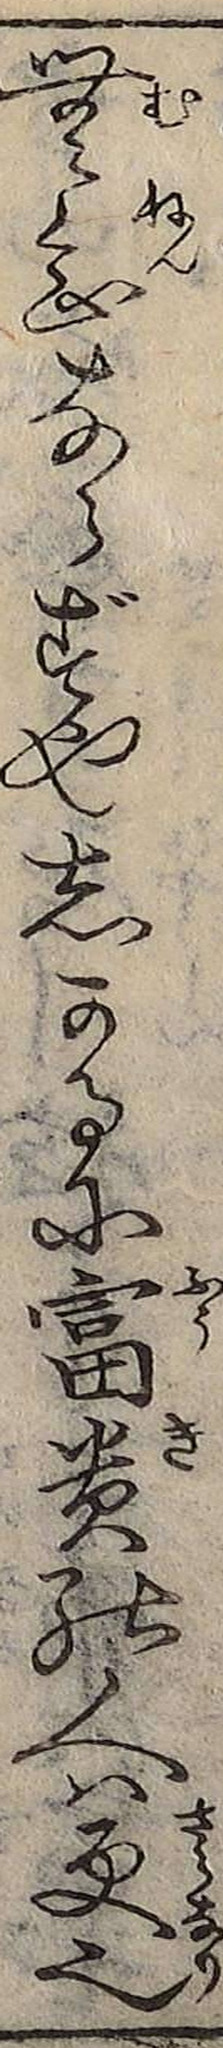無念ならずやしかるに富貴の人は更也
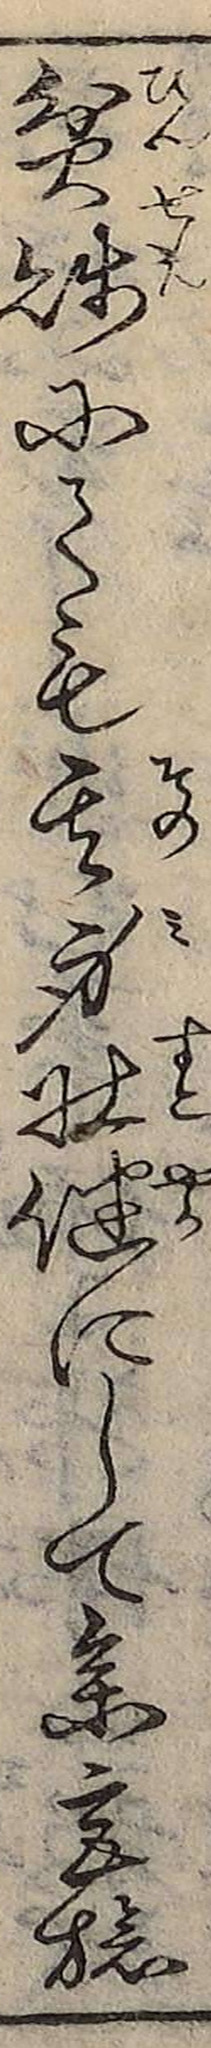貧賤にても其身壮健にして参宮旅
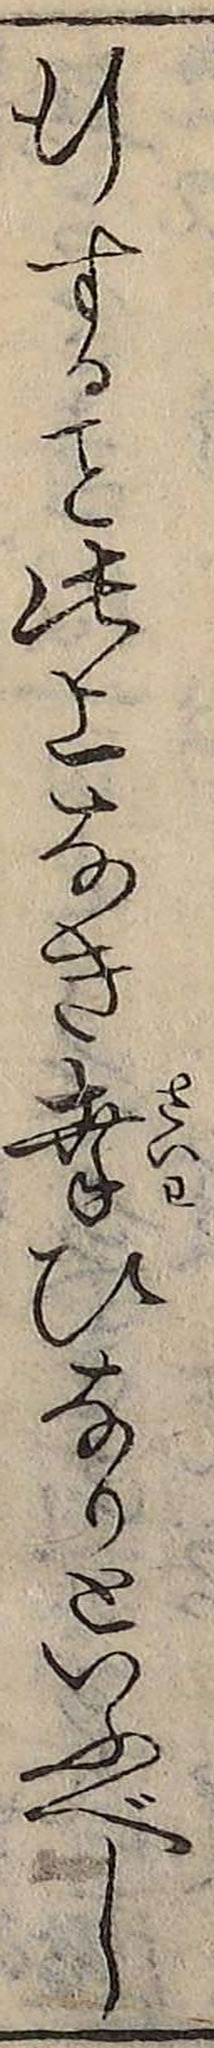行すること此上なき幸ひなりといふべし
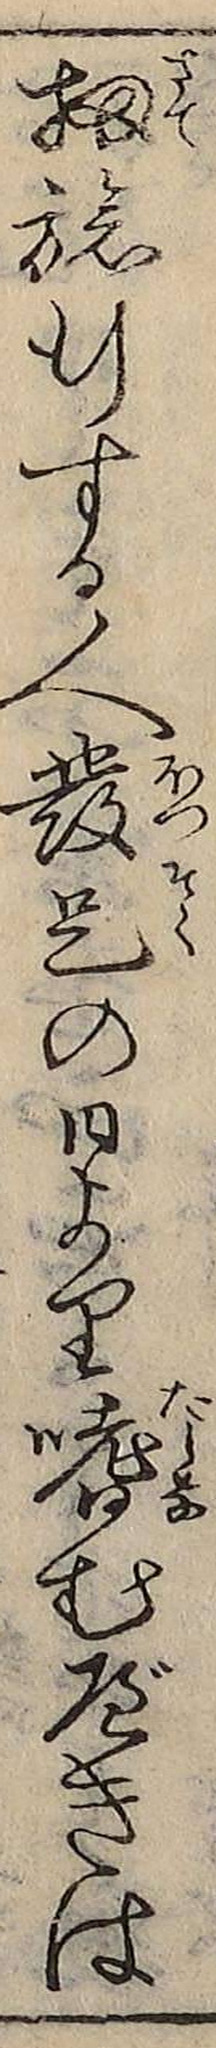扨旅行する人発足の日より嗜むべきは
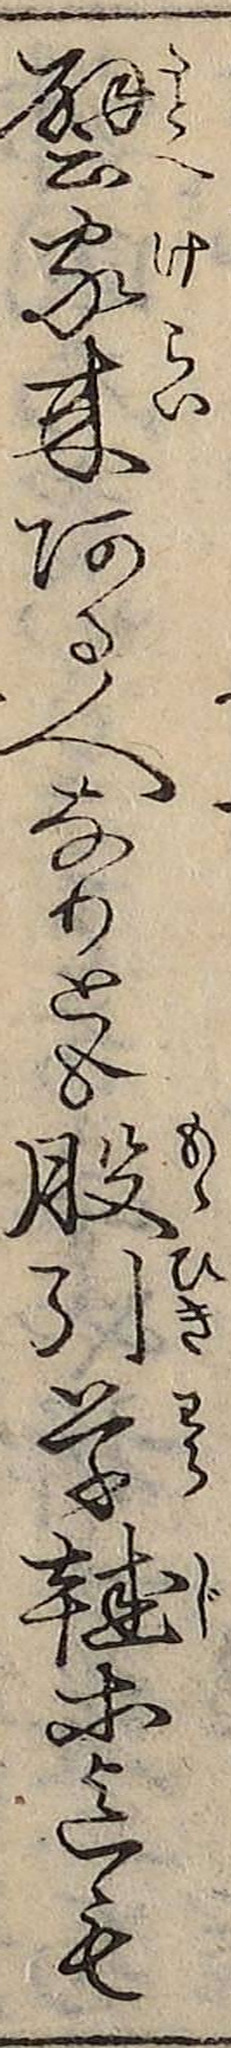譬家来ある人なりとも股引草鞋等迄も
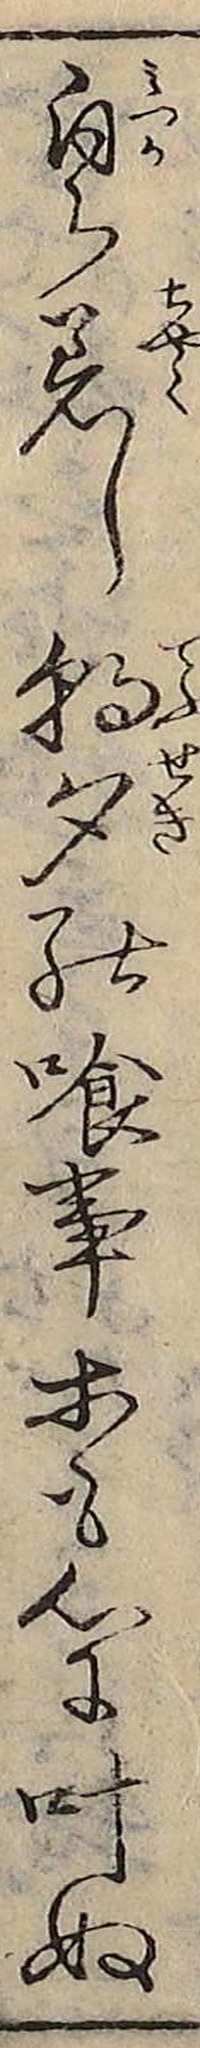自ら着し朝夕の喰事等も心に叶ぬ
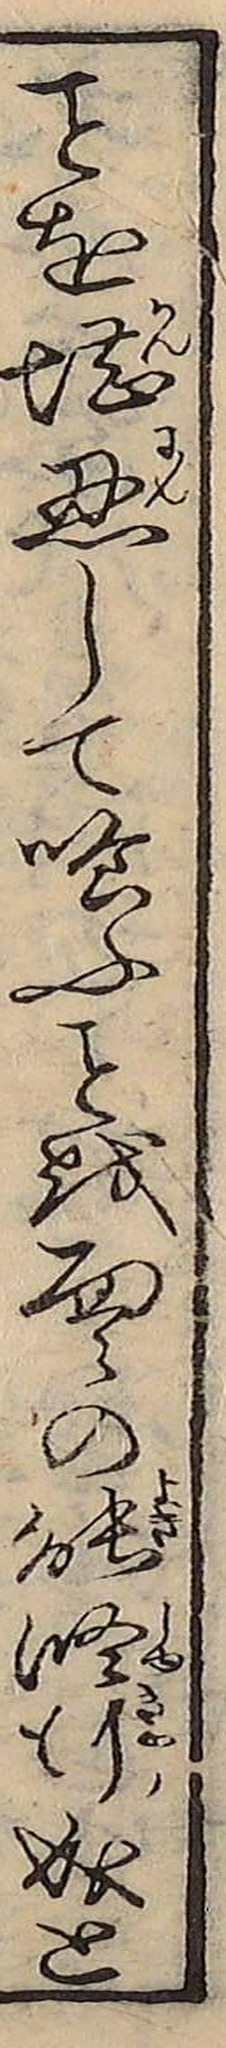ことを堪忍して喰ふことを面々の能修行成と
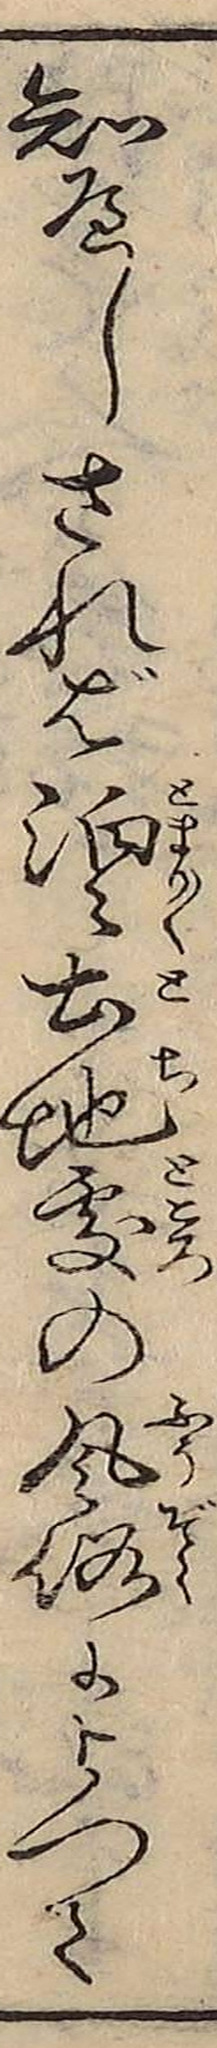知へしされば泊々土地処の風俗によつて
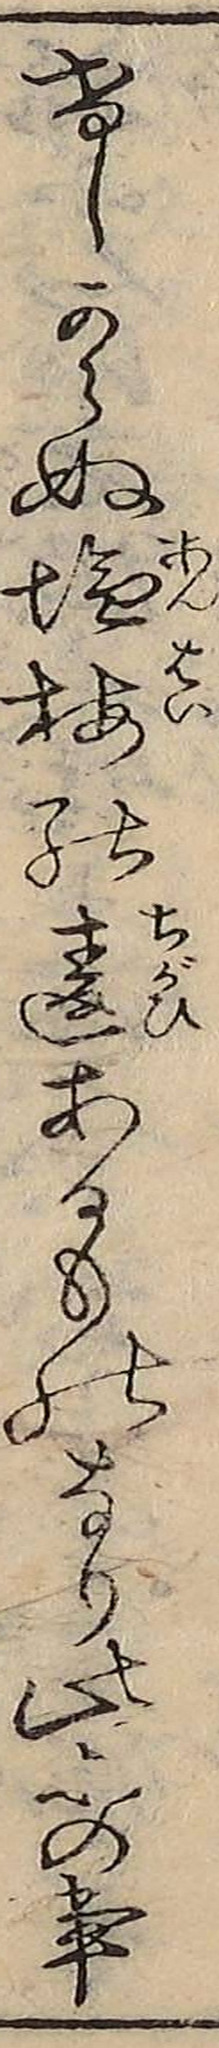けしからぬ塩梅の違あるものなり此の事
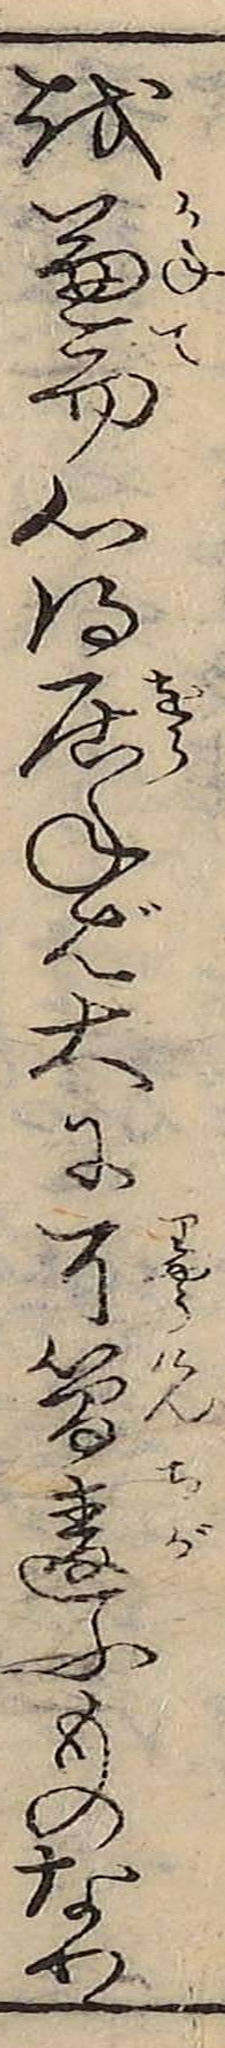を兼而心得居ねば大に了簡違ふものなり
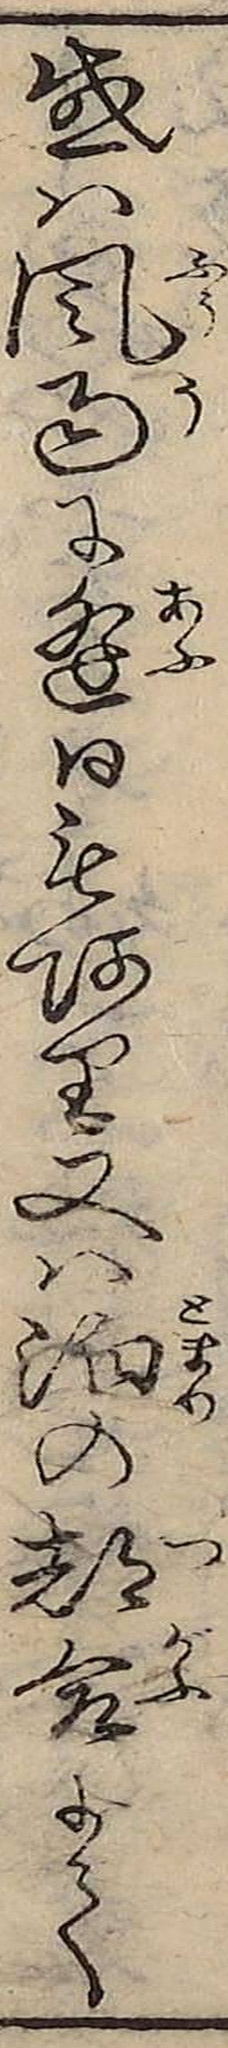或は風雨に逢日もあり又は泊の都合にて
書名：旅行用心集
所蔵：神戸大学附属図書館 国文学研究資料館
